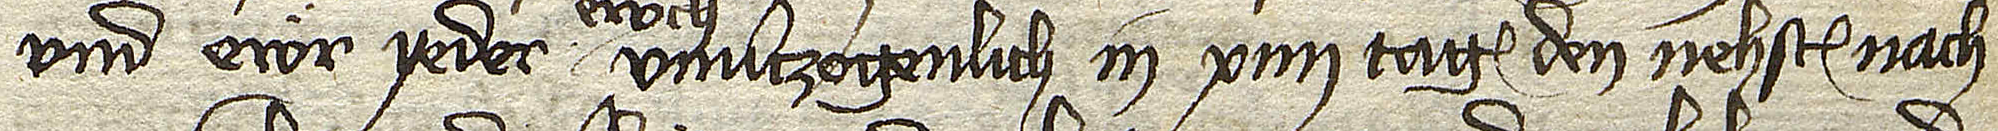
vnd eẅr yeder vnu*cʒogenlich in xiiii tag* den nehſt* nach
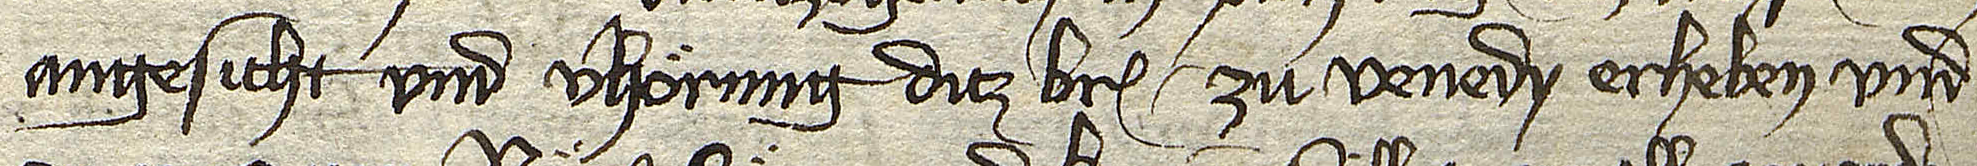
angeſicht vnd v*hörung dicʒ br* / ʒu venedy erheben vnd
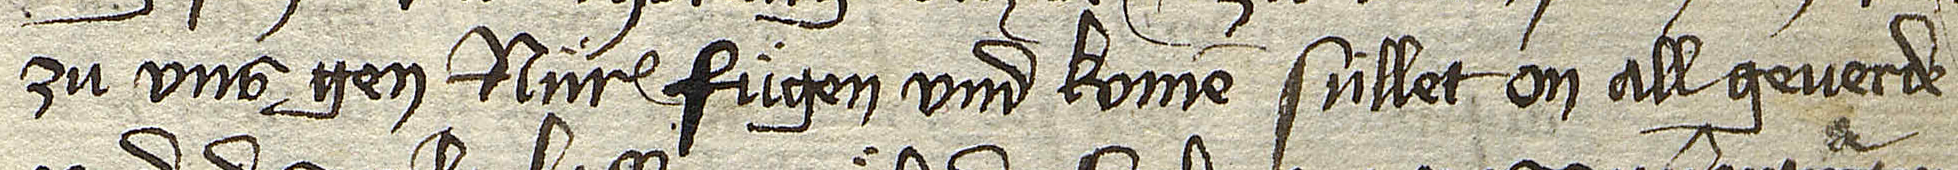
ʒu vns gen Nür* fügen vnd kome* ſüllet on all geuerde
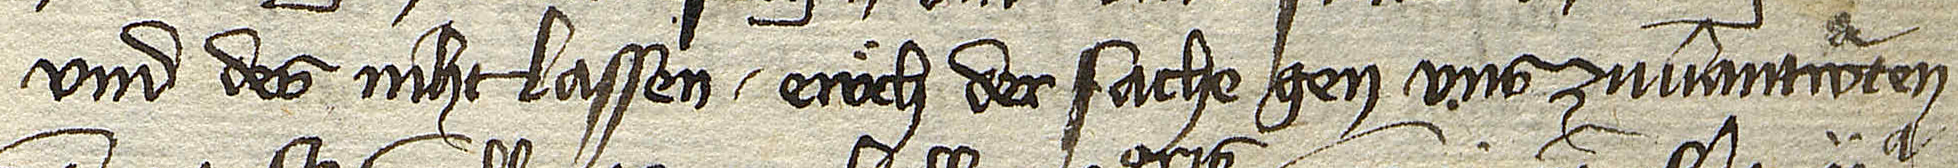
vnd des niht laſſen / eẅch der ſache gen vns ʒuu*antw*ten
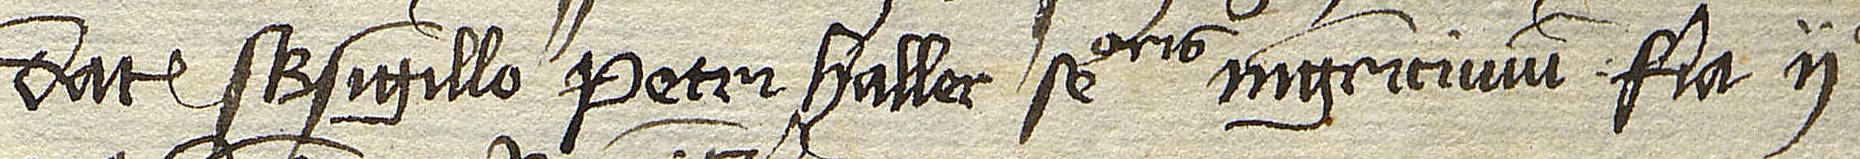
Dat* ſ* ſigillo Petri haller ſe* m*griciuiu* . fi*a ii*
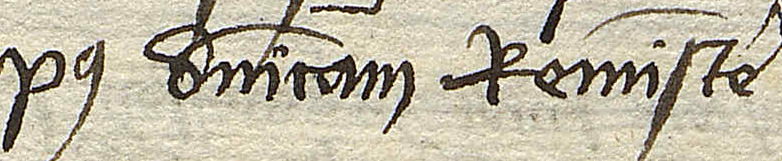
p* dni*cam Remi*ſce*
